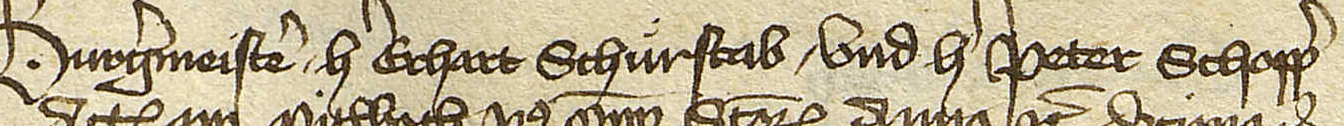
Burg*meiſte* / h* Erhart Schürſtab / vnd h* Peter Schopp*
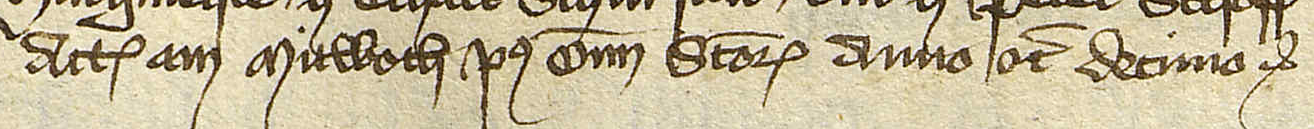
Act* am Mitwoch p* Omi* Sco* Anno ec* decimo §
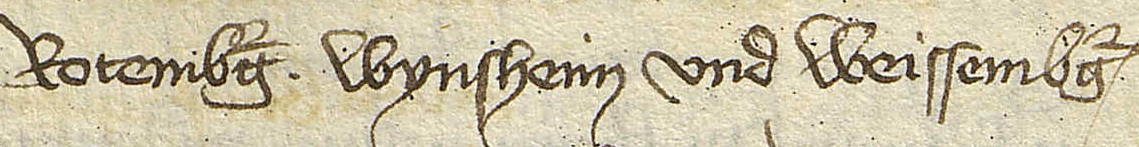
Rotemb*g . Wynſheim vnd Weiſſemb*g
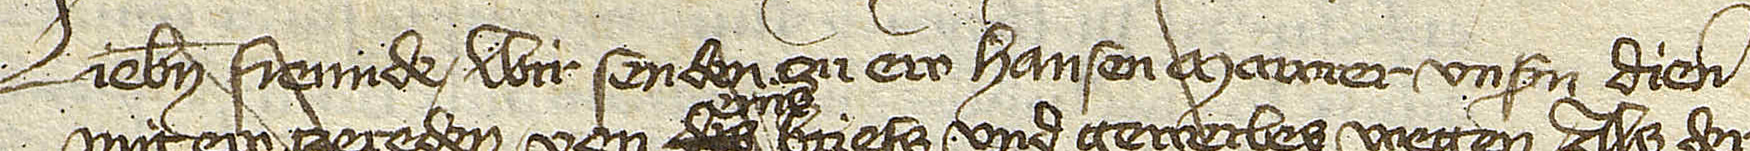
Liebn* freunde / wir ſenden cʒu ew hanſen Mawrer vnſ*n dien*
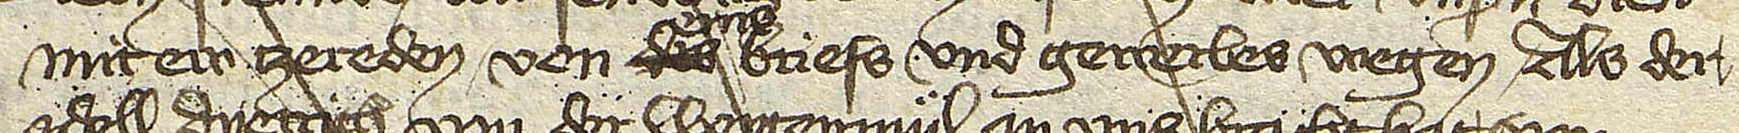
mit ew cʒereden / von des briefs vnd gewerbes wegen / Als der
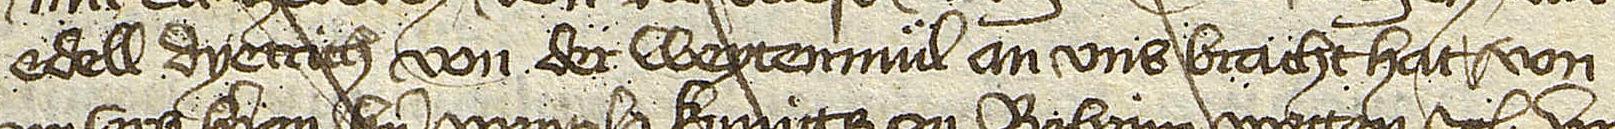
edell dyetrich von der weytenmül an vns bracht hat / von
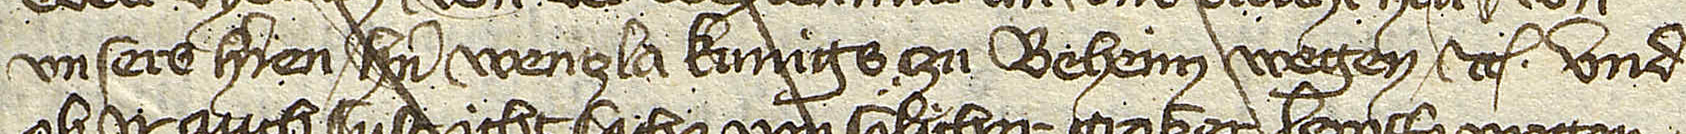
vnſers h*ren / hn* wencʒla kunigs cʒu Beheim wegen / ec* . vnd
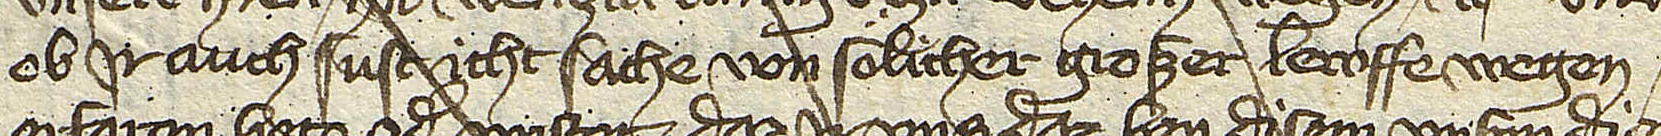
ob Ir auch ſuſt icht ſache von ſölicher groſʒer lewffe wegen
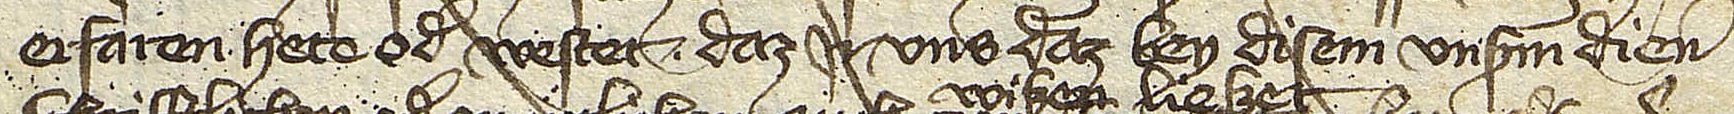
erfaren hete od* weſtet . daʒ Ir vns daʒ bey diſem vnſ*m dien*
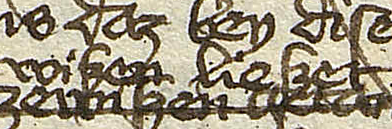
wiſʒen lieſʒet
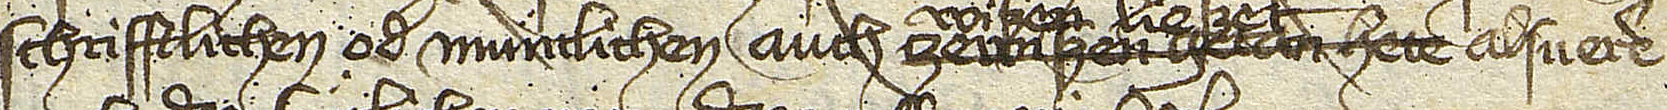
ſchrifftlichen od* müntlichen auch cʒewiſʒen getan hete alſuere*
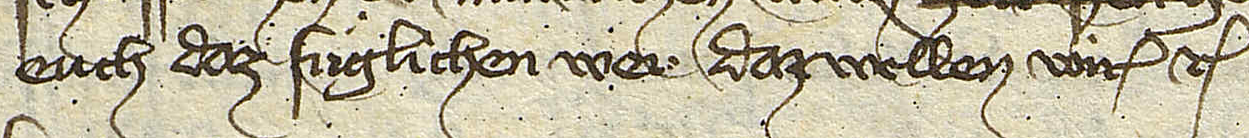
euch daʒ füglichen wer daʒ wellen wir* ec*
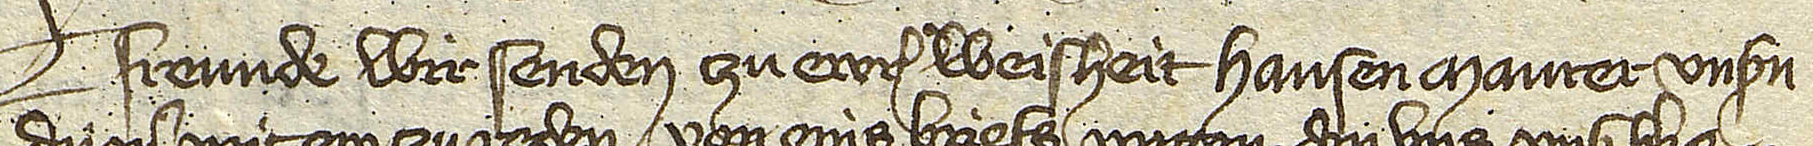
L* freunde wir ſenden cʒu ewr* weiſheit hanſen Mawrer vnſ*n
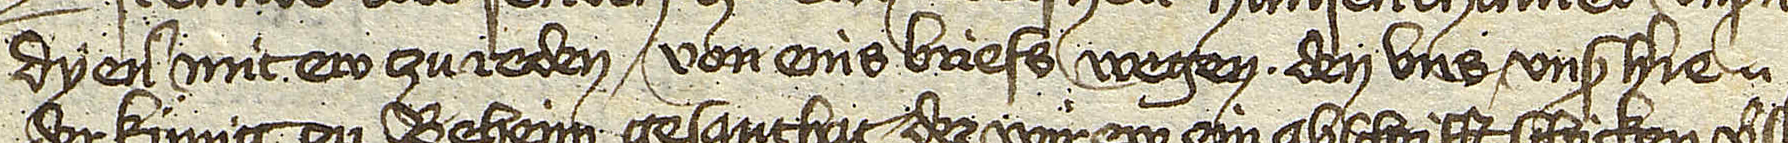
dyen* mit ew cʒu reden von eins briefs wegen . den vns vnſ* h*re ~
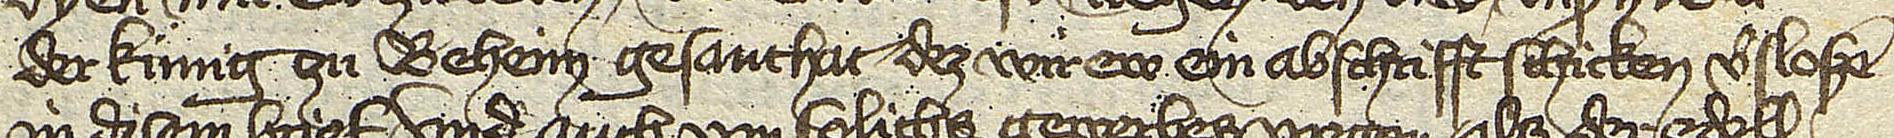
der künig cʒu Beheim geſant hat / deʒ wir ew ein abſchrifft ſchicken v*ſloſʒe*
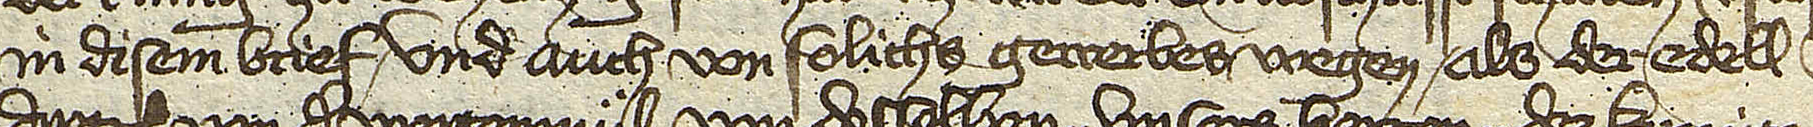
in diſem brief / vnd auch von ſolichs gewerbes wegen / als der edell
